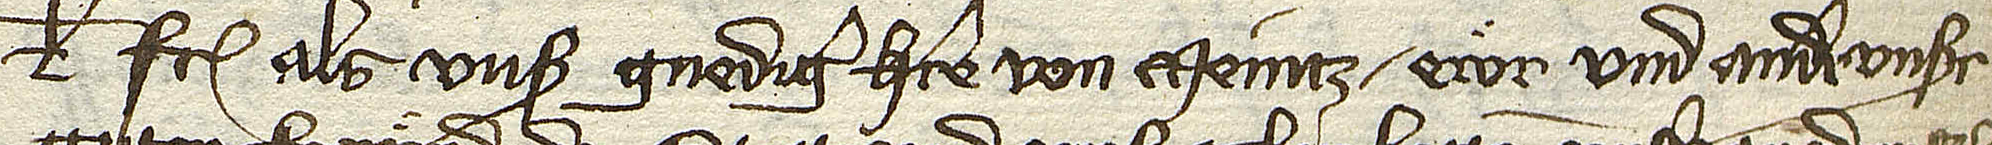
L* fr* als vnſ* gnedig* Hre* von Meincʒ / ewr vnd and* vnſ*r
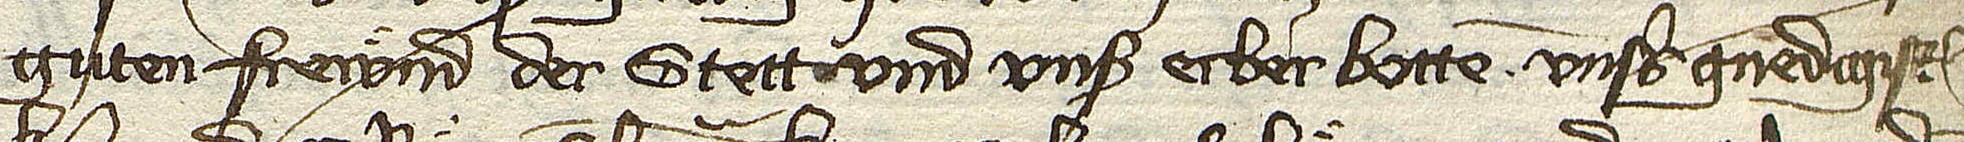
guten frewnd der Stett vnd vnſ* aber botte* . vnſs* gnedigiſt*
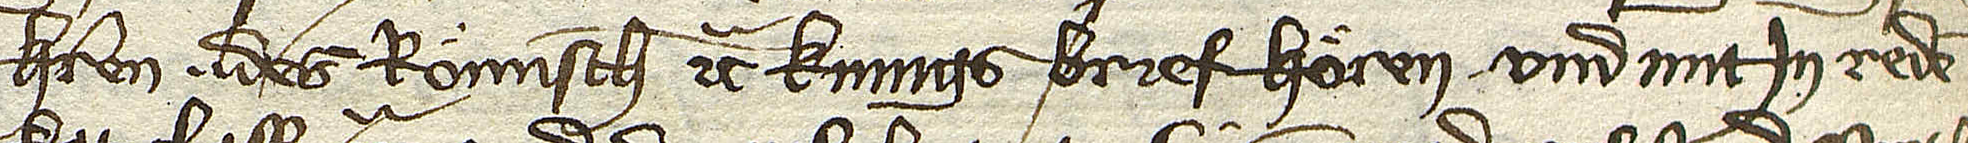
Hr*en ~ des Römiſch* ec* kunigs / brief hören vnd mit In rede*
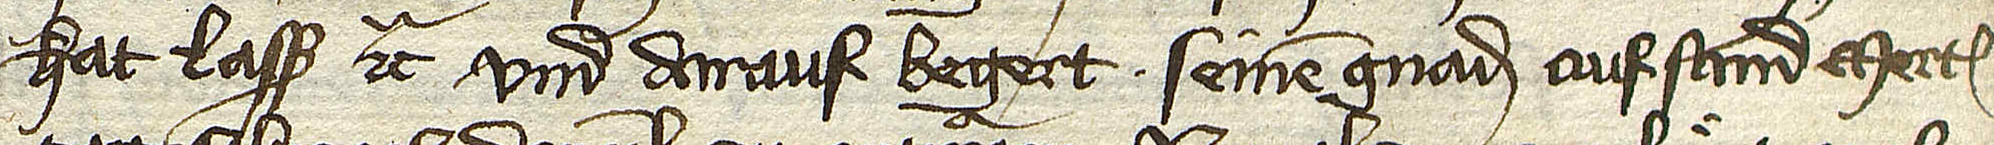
hat laſſ* ec. vnd darauf begert . ſeine* gnad auf ſand Mert*
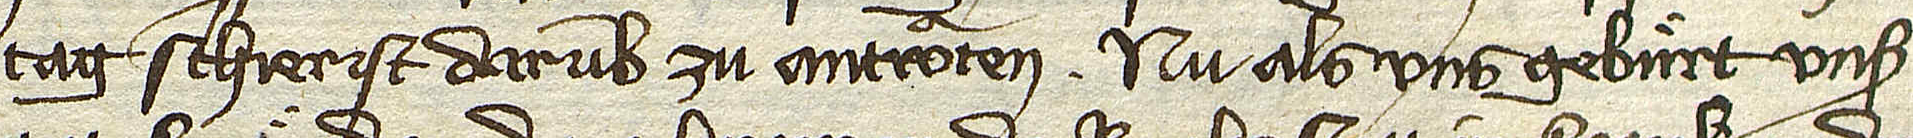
tag ſchieriſt darub* ʒu antw*ten . Nu als vns gebürt vnſ*
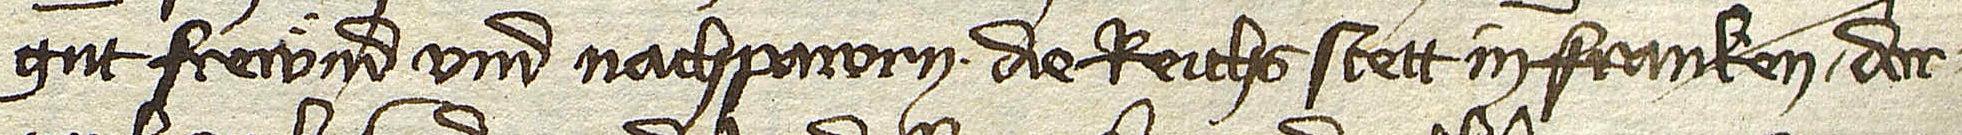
gut frewnd vnd nachpawrn . die Reichs ſtett in franken / dar =
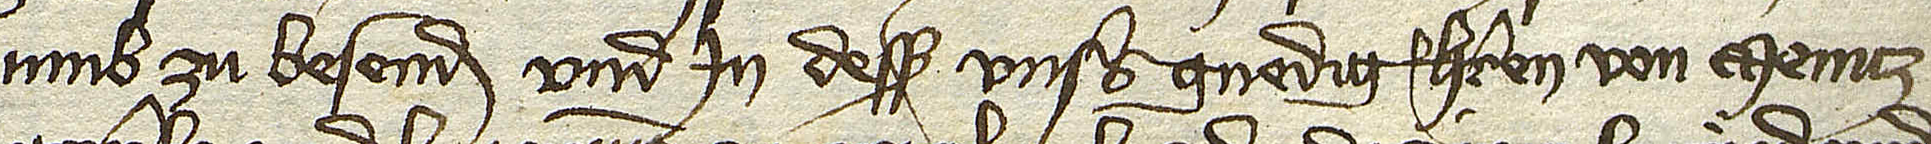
umb ʒu beſend* vnd In deſſʒ vnſ s* gnedig* Hr*en von Meincʒ
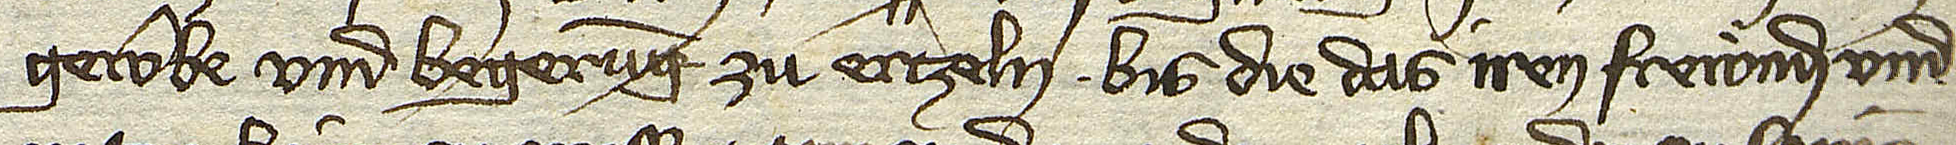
gew*be vnd begerug* ʒu ercʒeln . bis die das iren frewnd* vnd
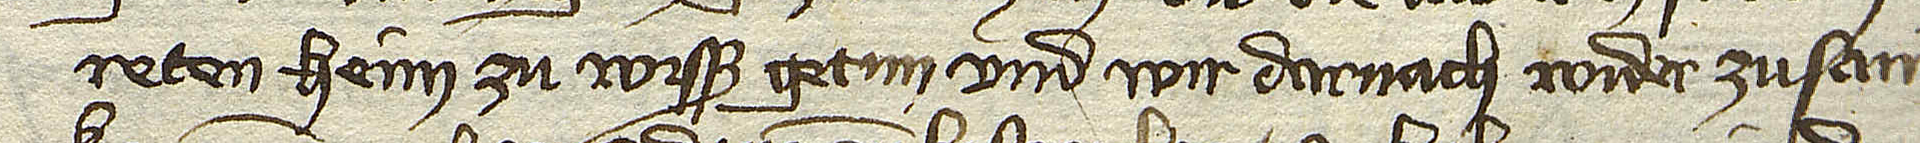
reten heim ʒu wiſſ* getan vnd wir darnach wider ʒuſame*
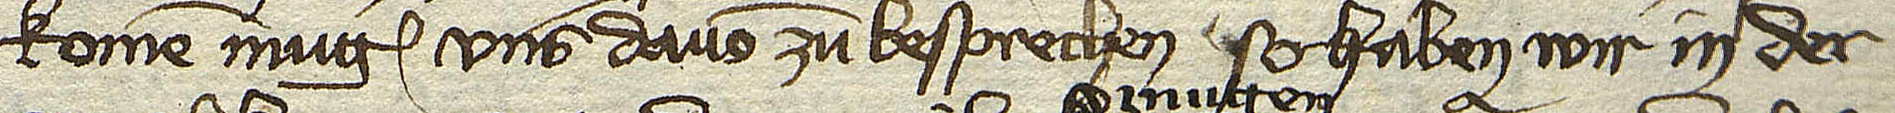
kome* mug* vns dau*o ʒu beſprechen ſo haben wir in der
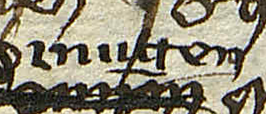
mugen
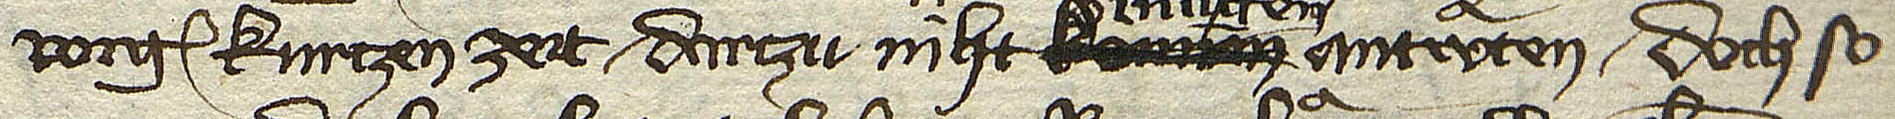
vorg* kurcʒen ʒeit / darcʒu niht kom*en antw*ten / Doch ſo
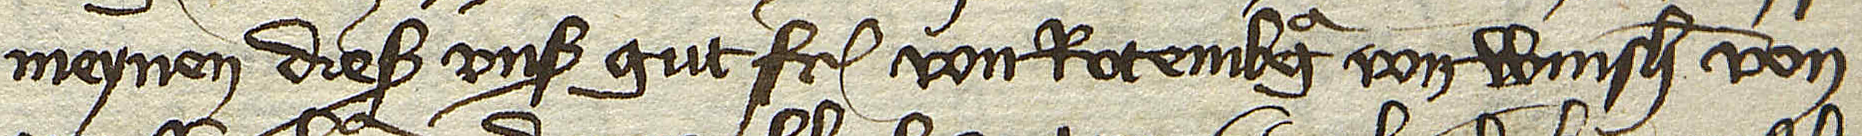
meynen dieſ* vnſ* gut fr* von Rotemb*g von Winſh* von
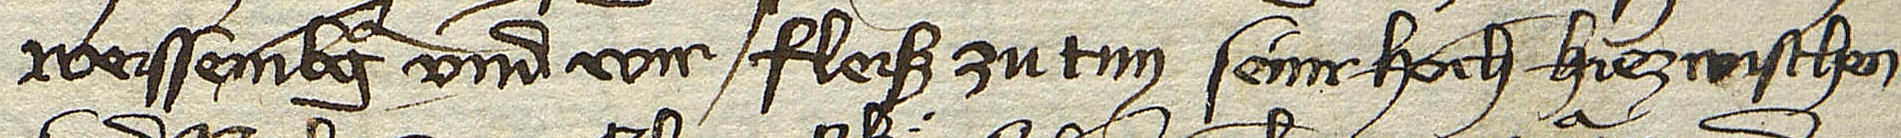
weiſſemb*g vnd wir / fleiſʒ ʒu tun ſeinr hoch* hieʒwiſchen
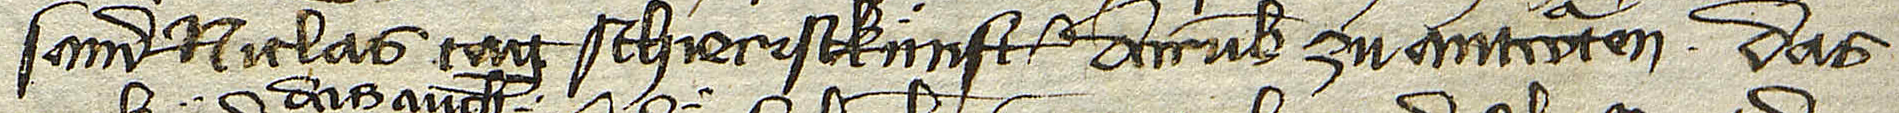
ſand Niclas tag ſchieriſtkünft* Da*rub ʒu antw*ten . Das
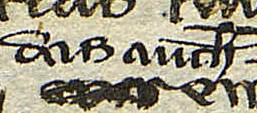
das auch
